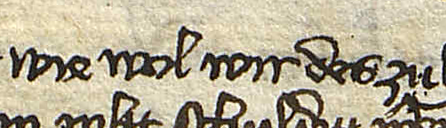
wie wol wir des ʒu
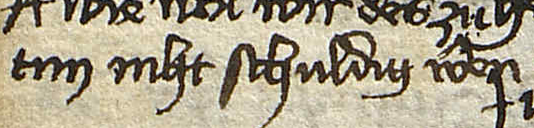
tun niht ſchuldig w*en
